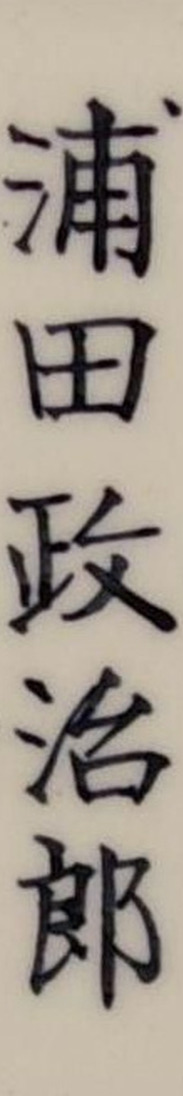浦田政治郎
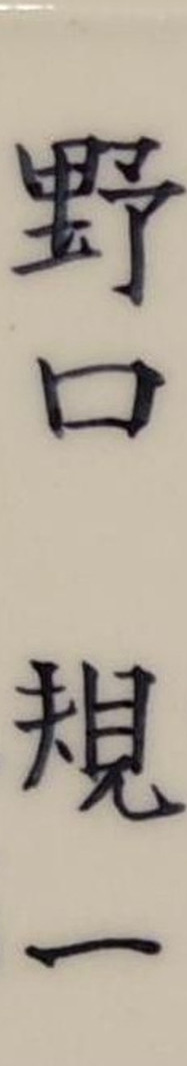野口規一
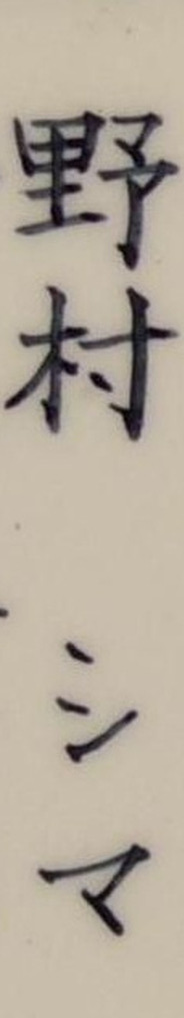野村シマ
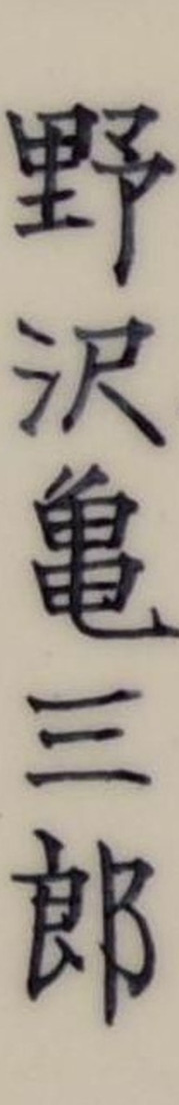野沢亀三郎
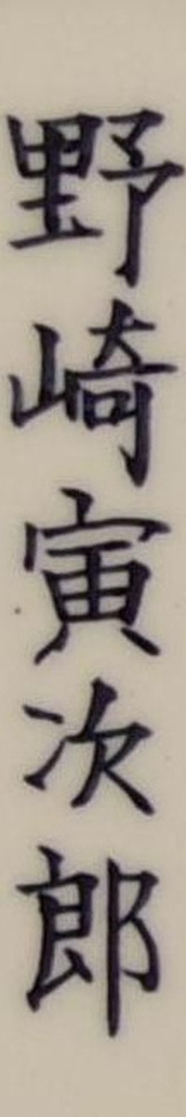野崎寅次郎
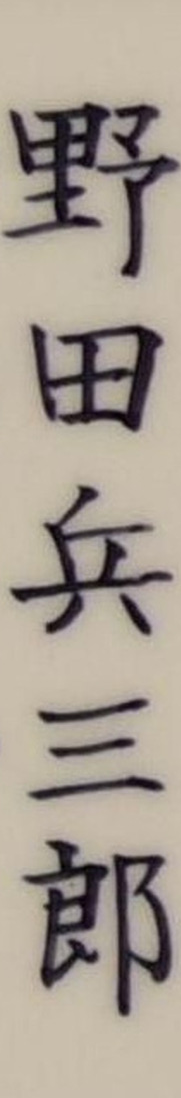野田兵三郎
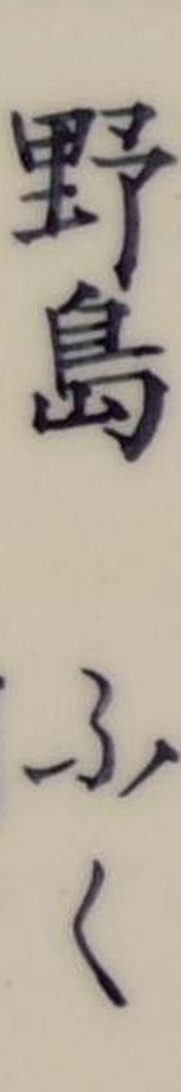野島ふく
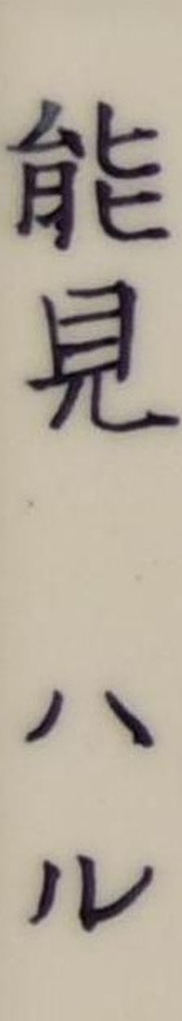能見ハル

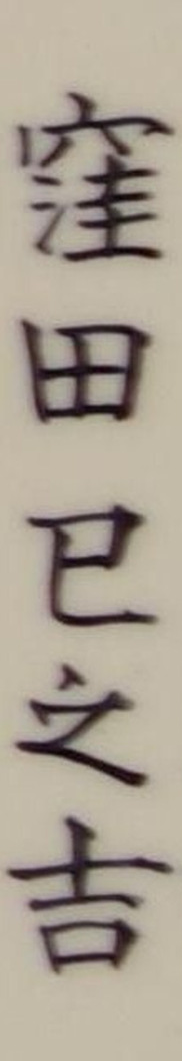窪田巳之吉
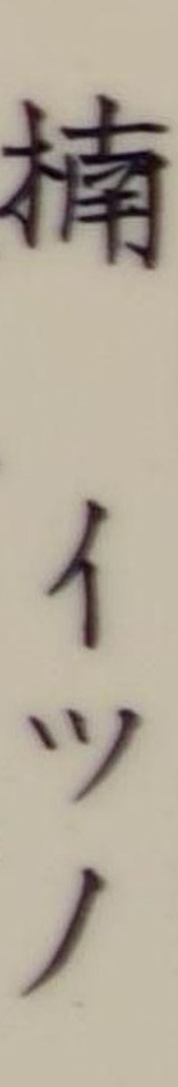楠イツノ
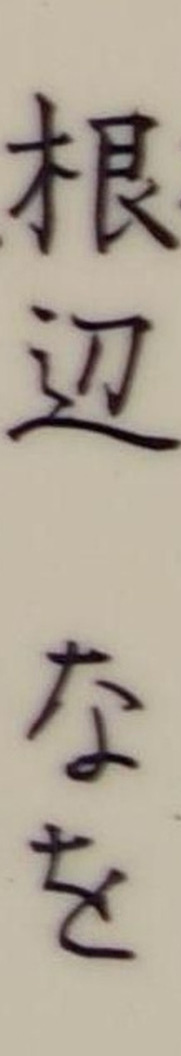根辺なを
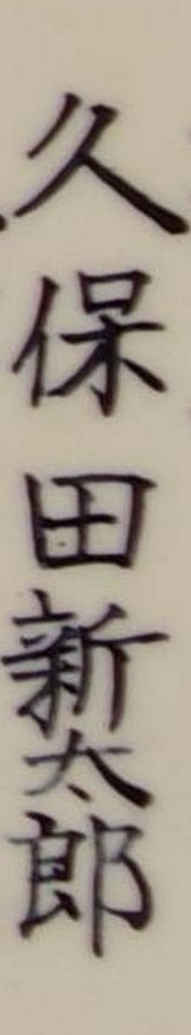久保田新太郎
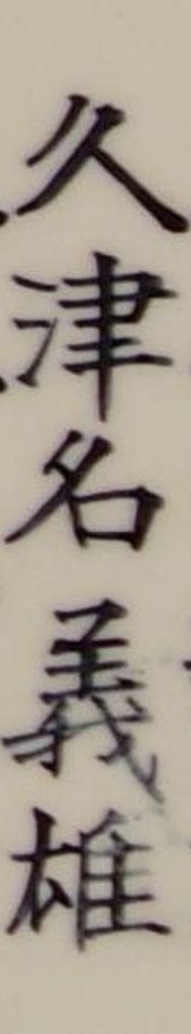久津名義雄
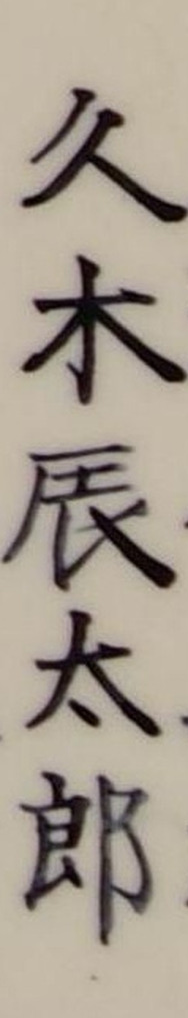久木辰太郎
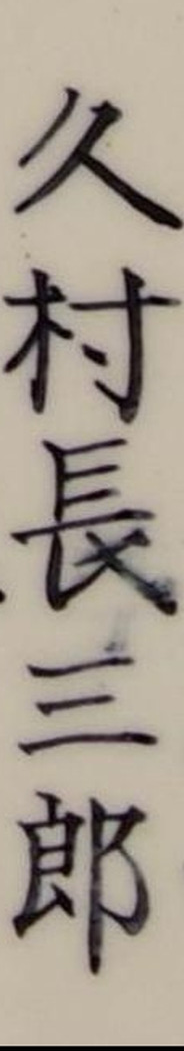久村長三郎
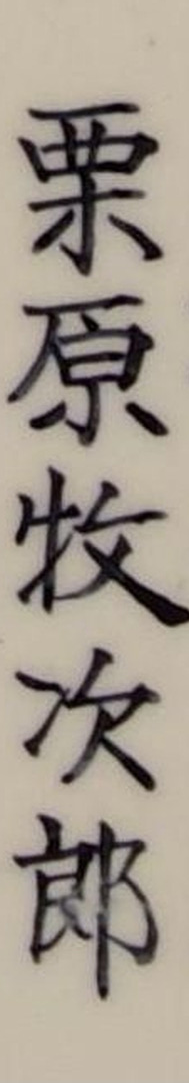栗原牧次郎
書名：E~L
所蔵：高野山金剛峯寺
